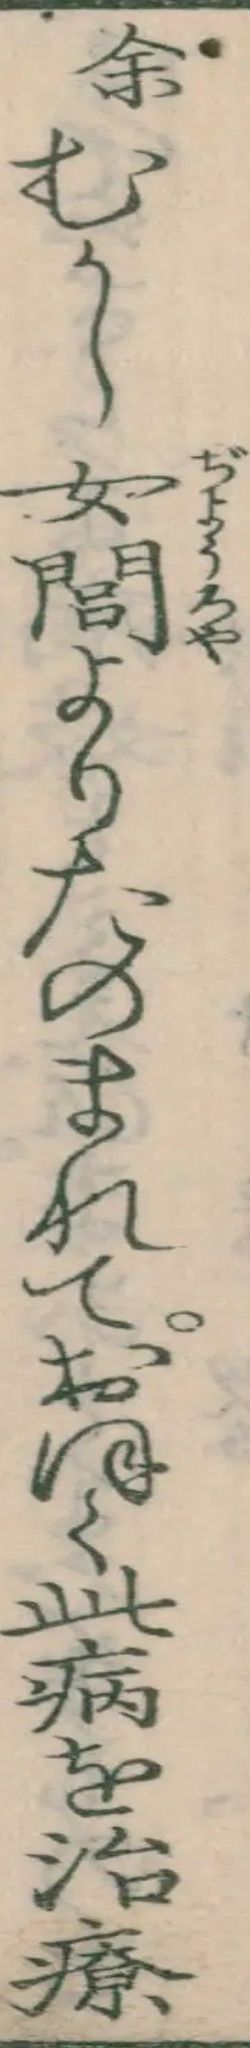余むかし女閭よりたのまれて。おほく此病を治療
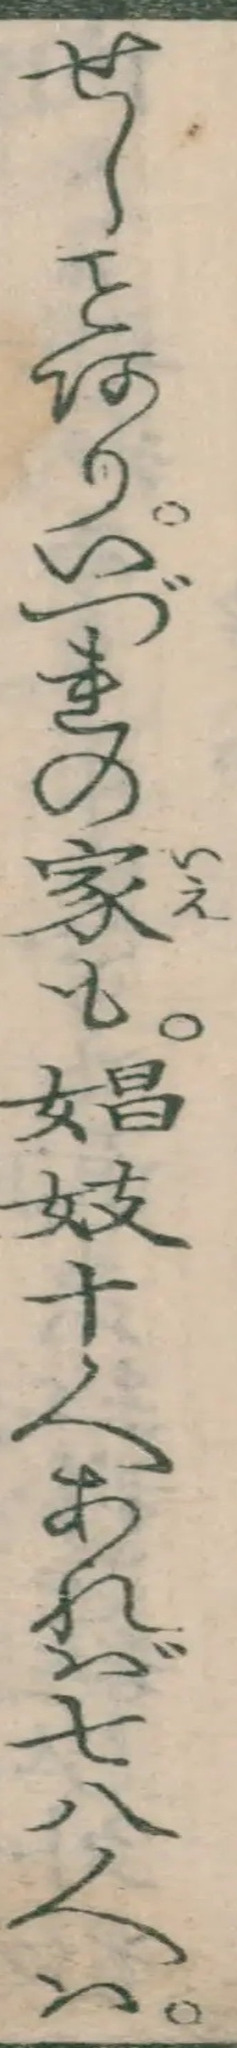せしことあり。いづれの家も。娼妓十人あれば七八人は。

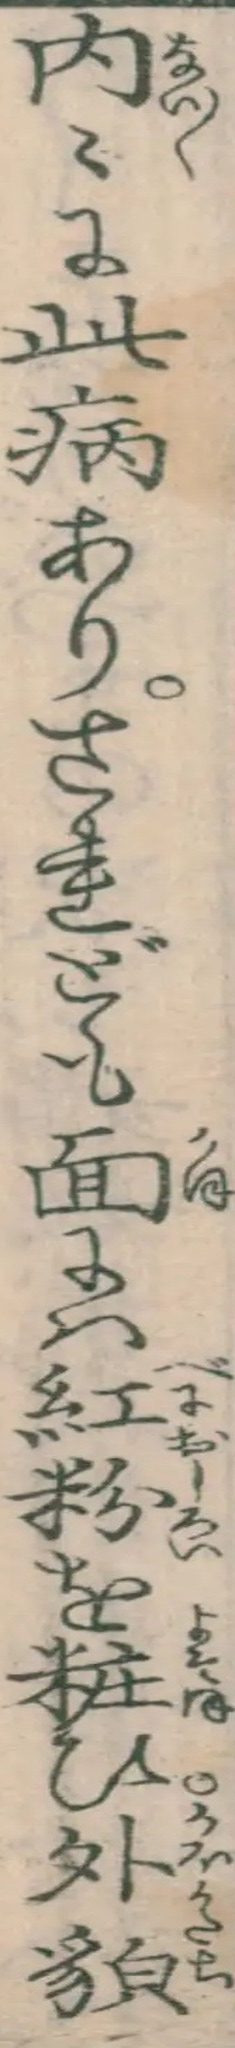内々に此病あり。されども面には紅粉を粧ひ外貌
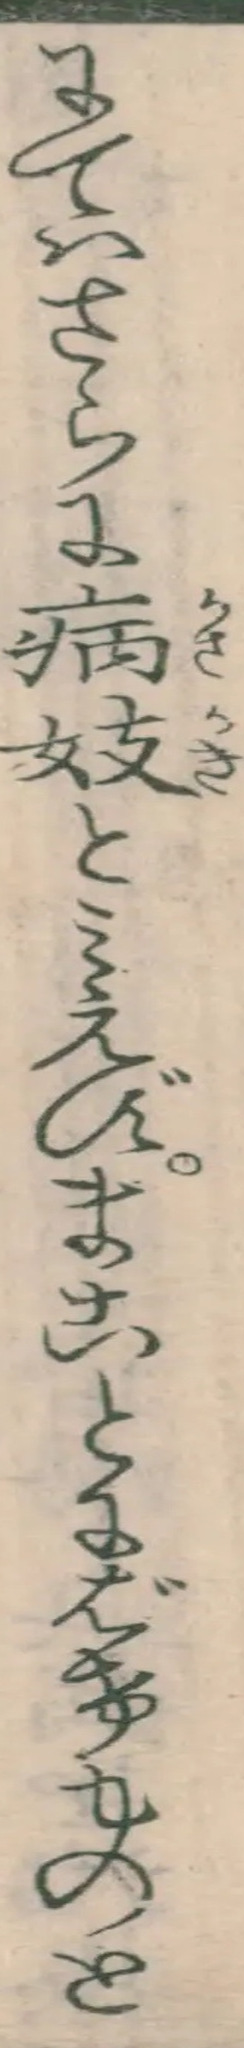にてはさらに病妓とみえず。まことにばけものと
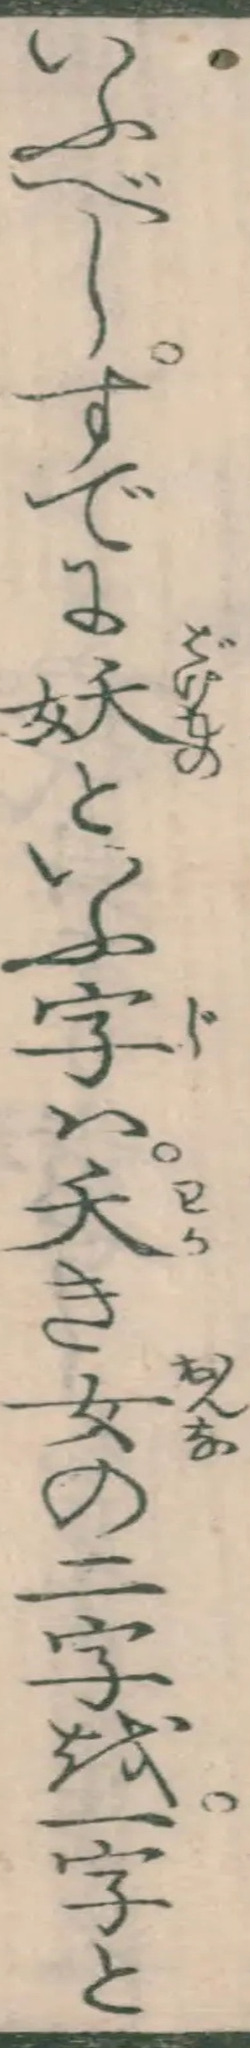いふべし。すでんい妖といふ字は。夭き女の二字を。一字と
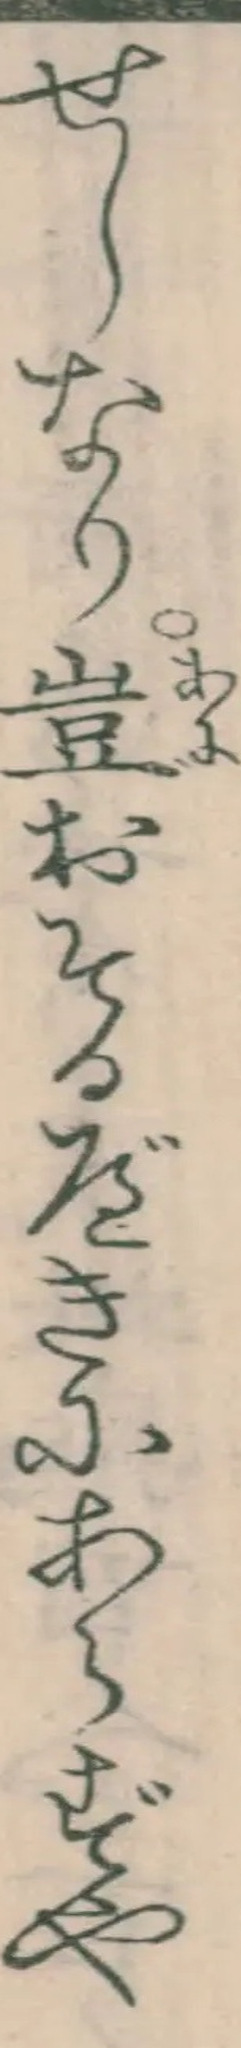せしなり。豈おそるべきにあらずや
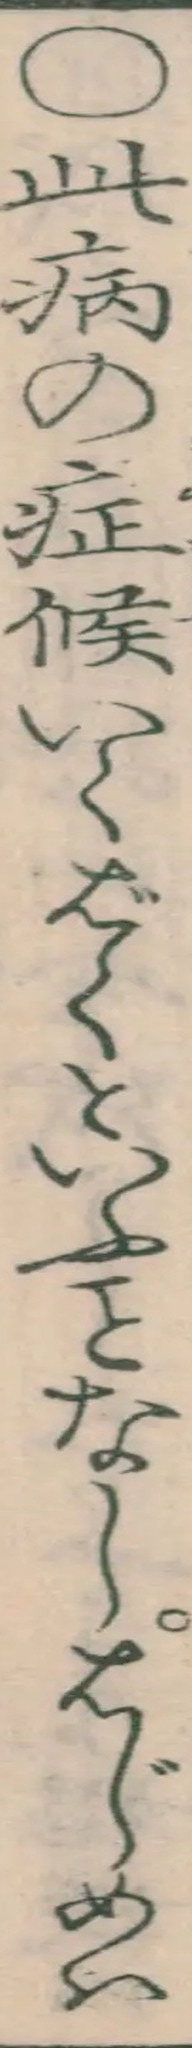〇此病の症候いくばくといふことなし。はじめは
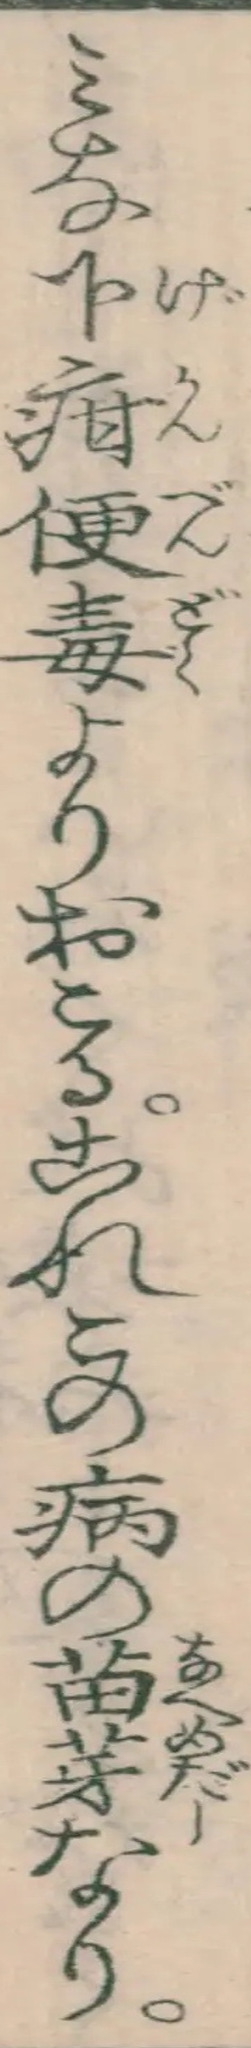みな下疳便毒よりおこる。これこの病の苗芽なり。
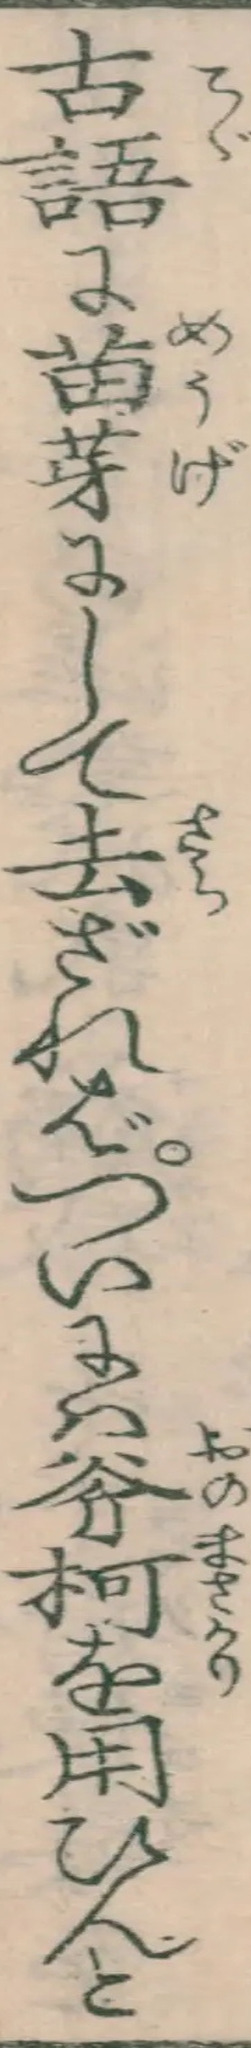古語に苗芽にして去ざれば。ついには斧柯を用ひんと
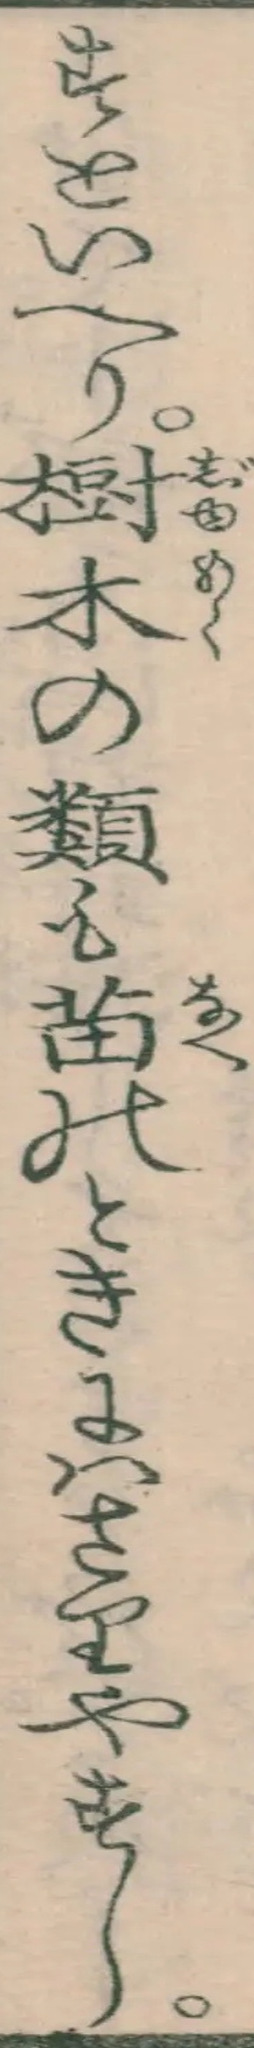すといへり。樹木の類も苗のときにはさりやすし。
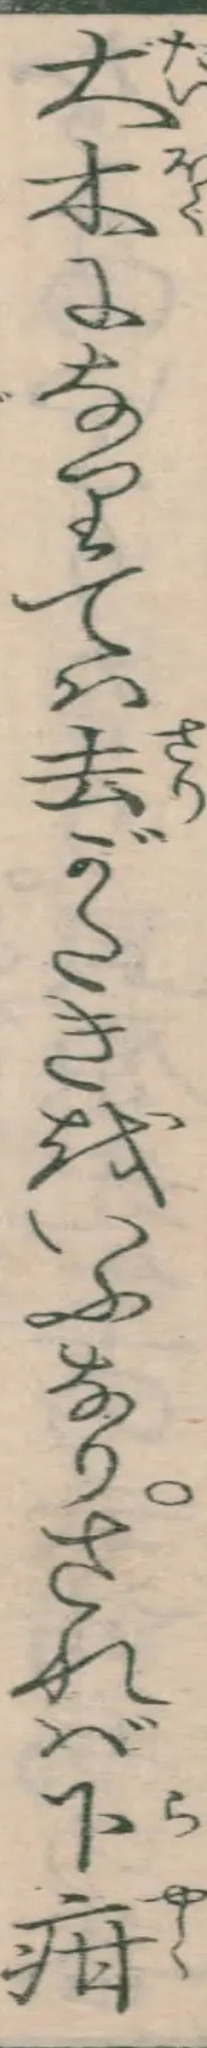大木になりては去がたきをいふなり。されば下疳
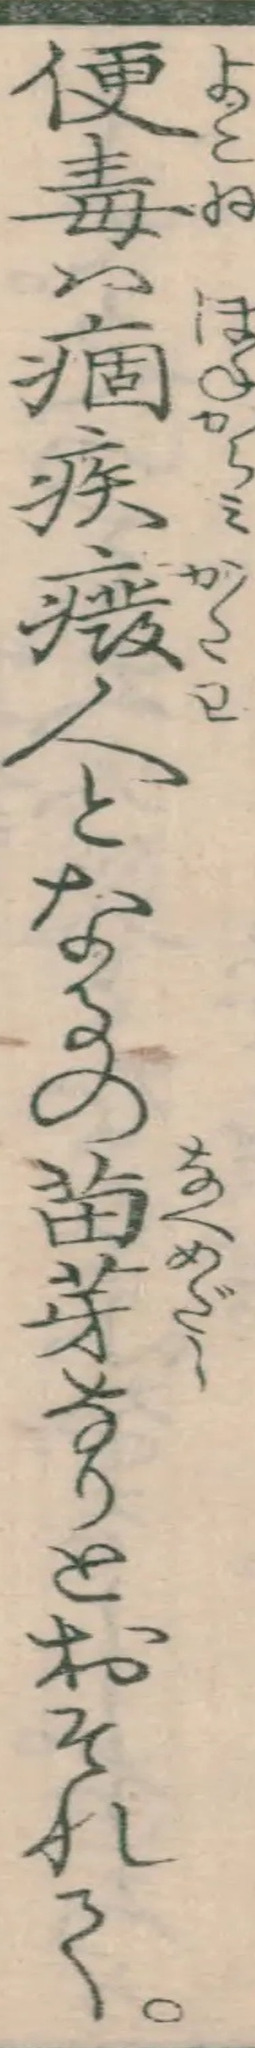便毒は痼疾廢人となるの苗芽なりといおしれて。
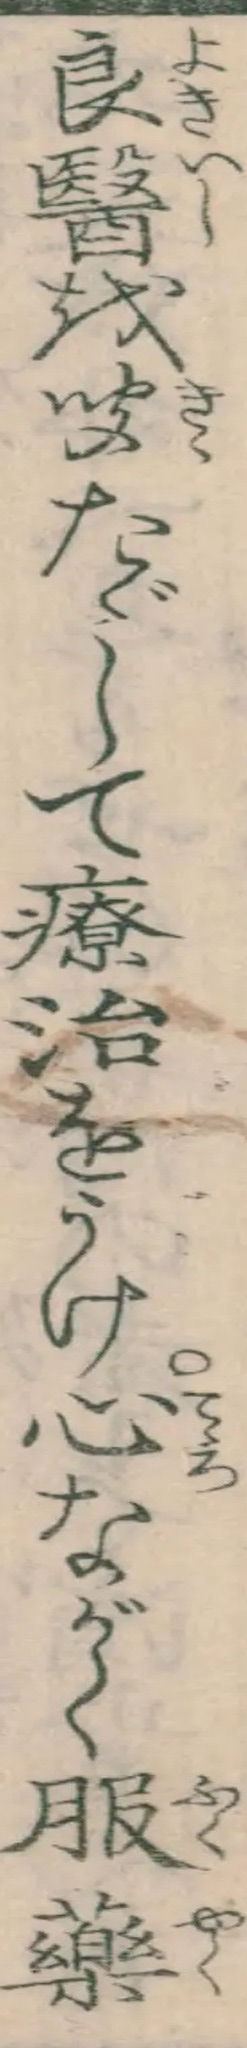良醫を聞たゞして療治をうけ。心ながく服薬
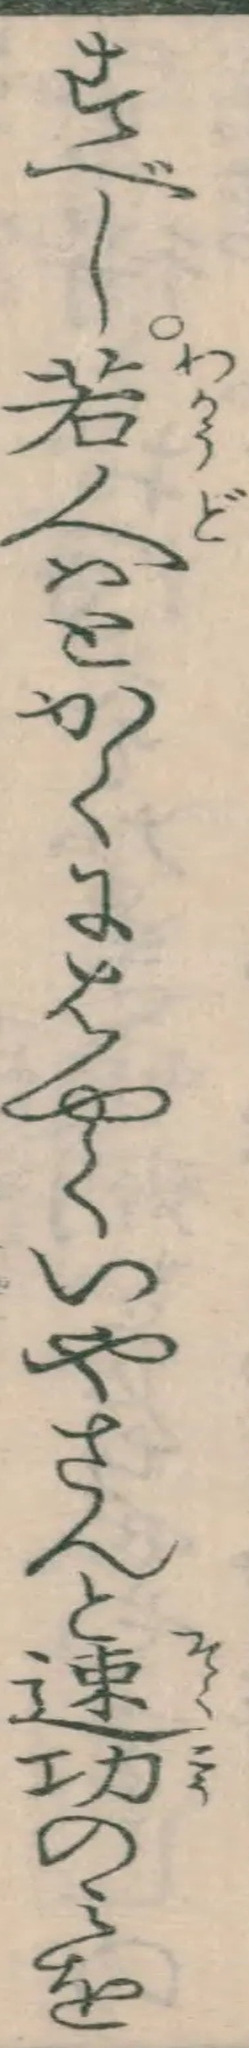すべし。若人はとかににはやくいやさんと速攻のみを
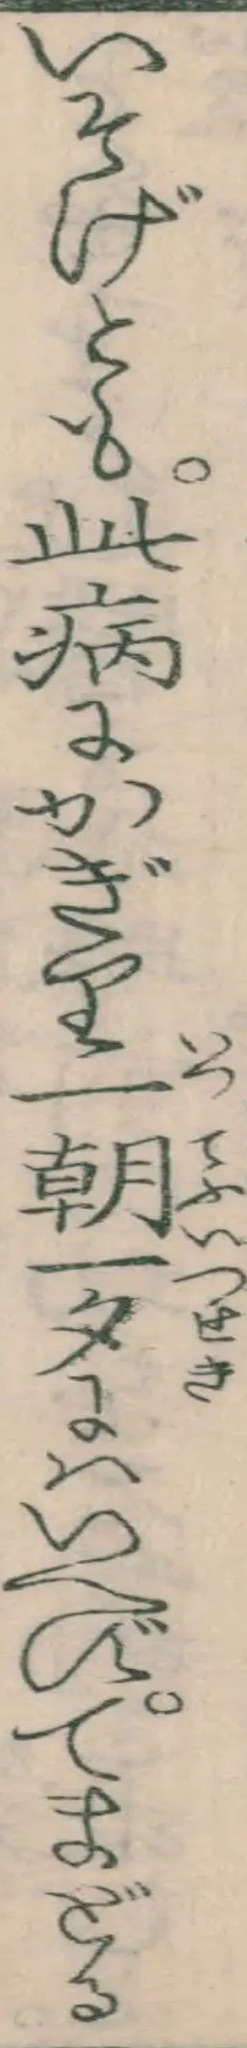いそげとも。此病にかぎり一朝一夕にはいへず。てまどる
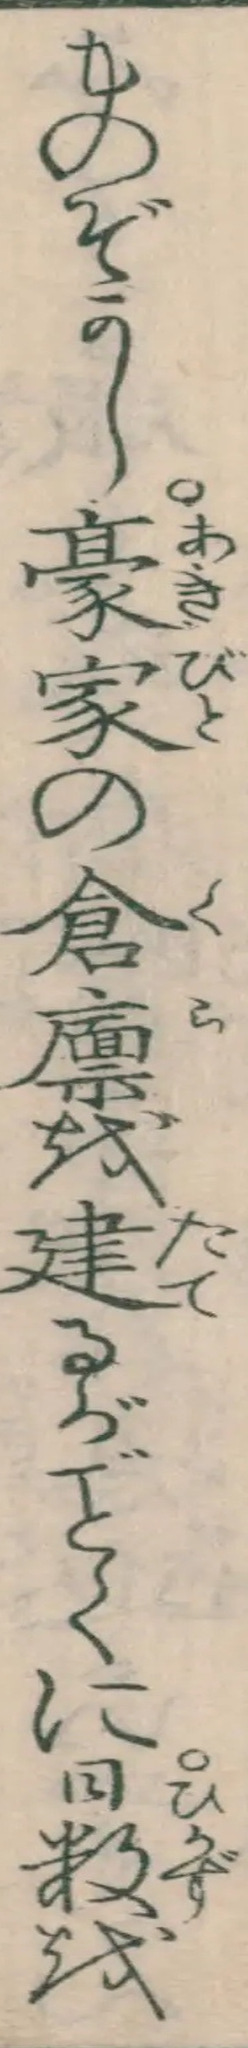ものぞかかし。豪家の倉を建るがごとくに。日数を
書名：瘡家示訓
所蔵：国立国会図書館 National Diet Library, JAPAN
